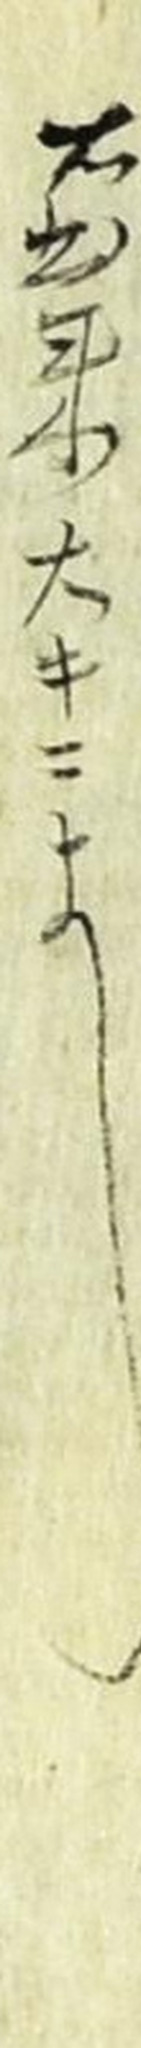右出来大キニよし
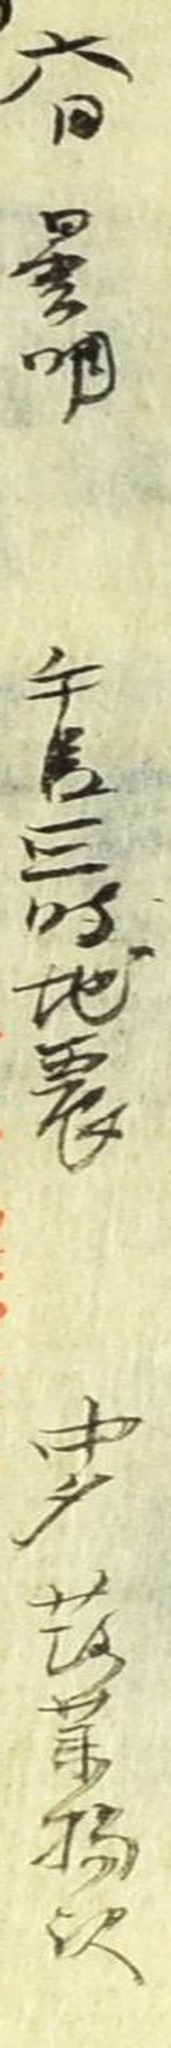○六日曇明午後三時地震中夕蕗菜揚沢
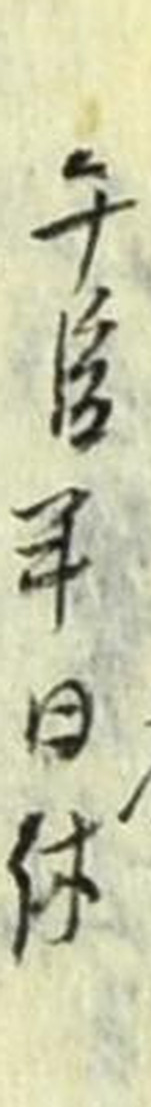午後半日休
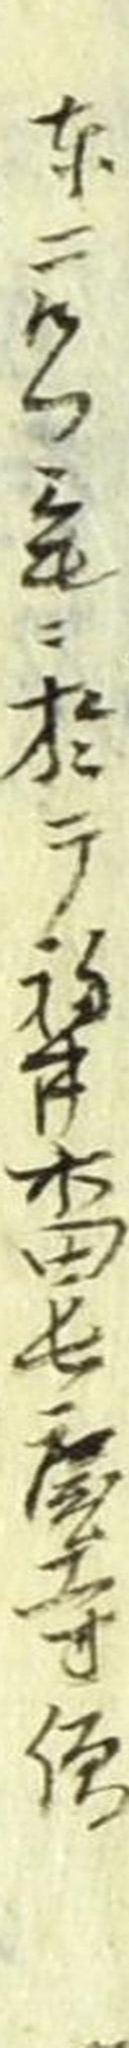東二左衛門宅ニ於テ福井木田長慶寺僧
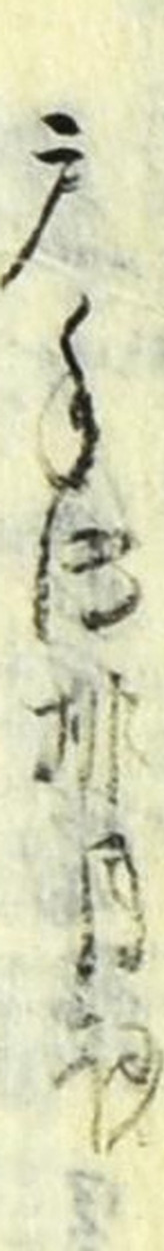戸手伝排月

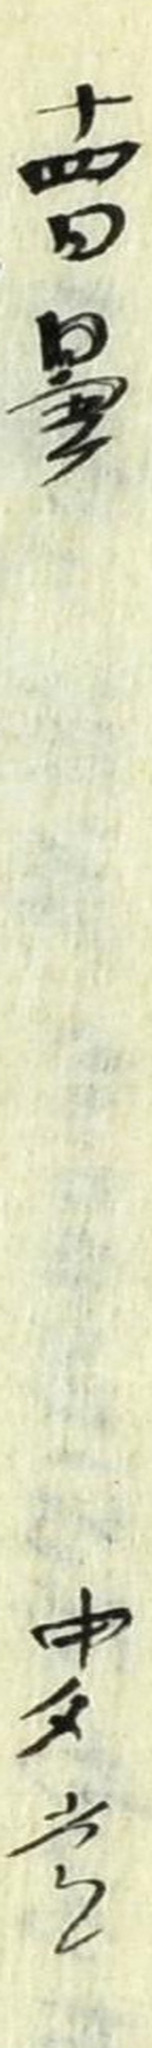十四日曇中夕常
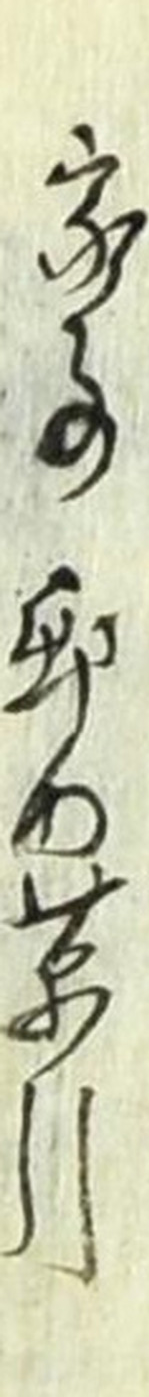家事邸内草引
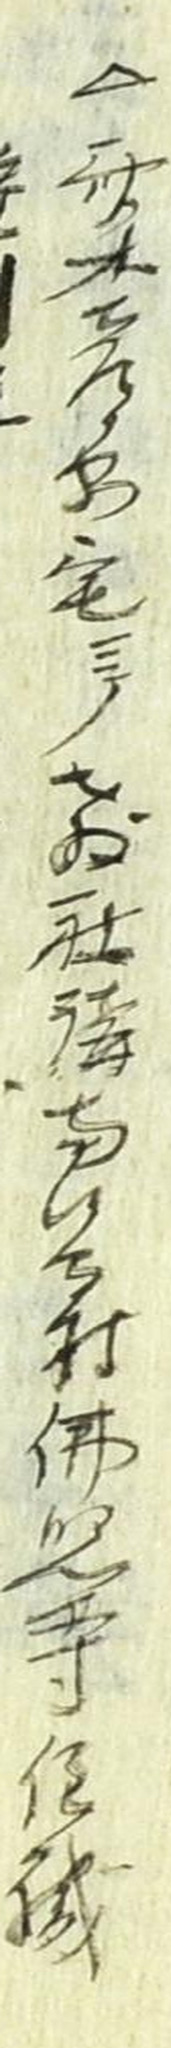△斉木彦兵衛宅ニテ教社講南江守村仏照寺住職
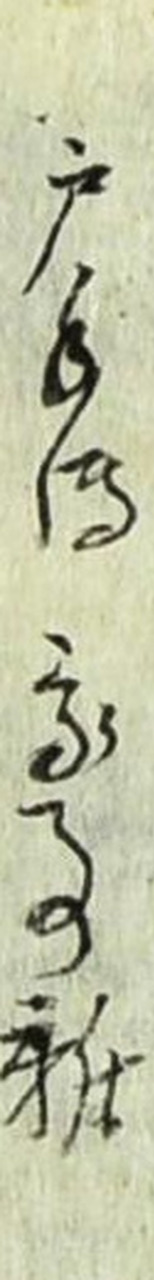戸手伝家事雑
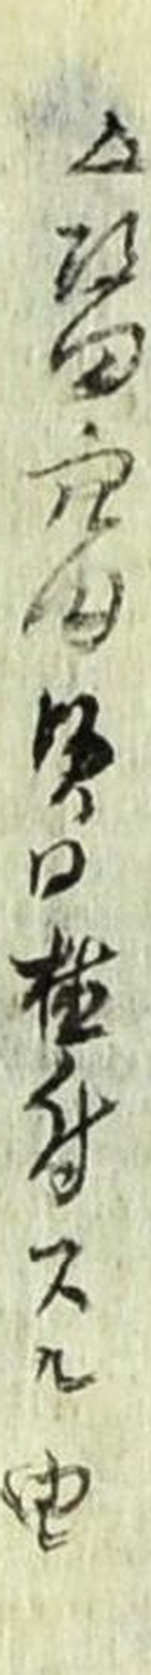△改田穴田頃日植付スル由
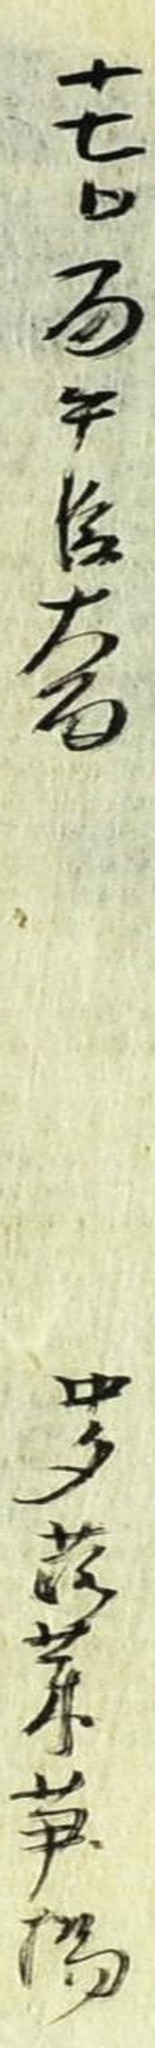十七日雨午後大雨中夕蕗菜笋揚
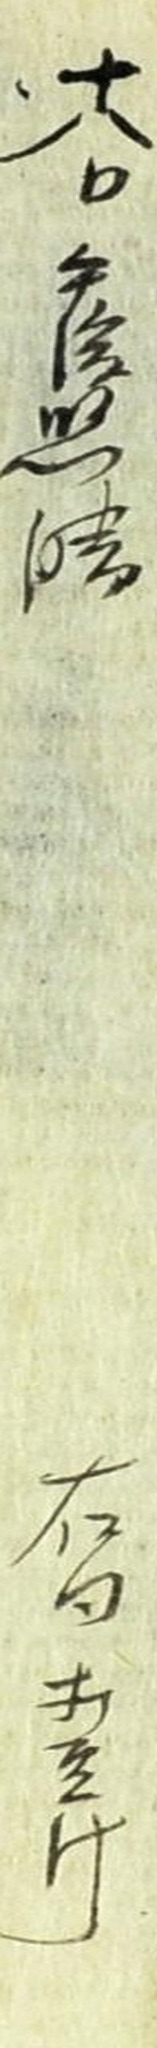十八日午後照晴右同打豆汁
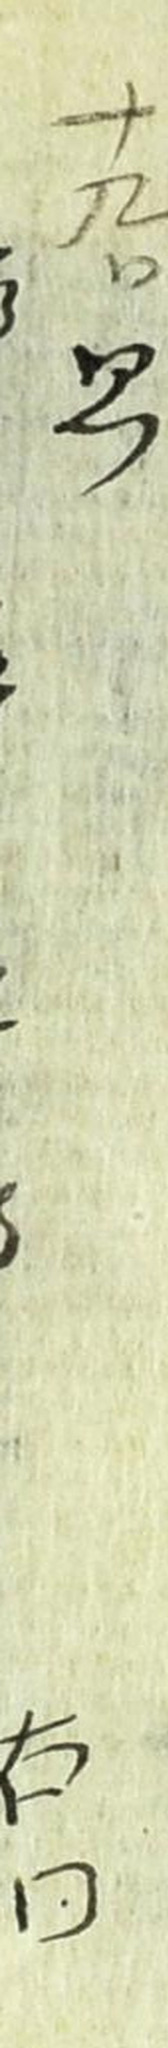十九日照右同
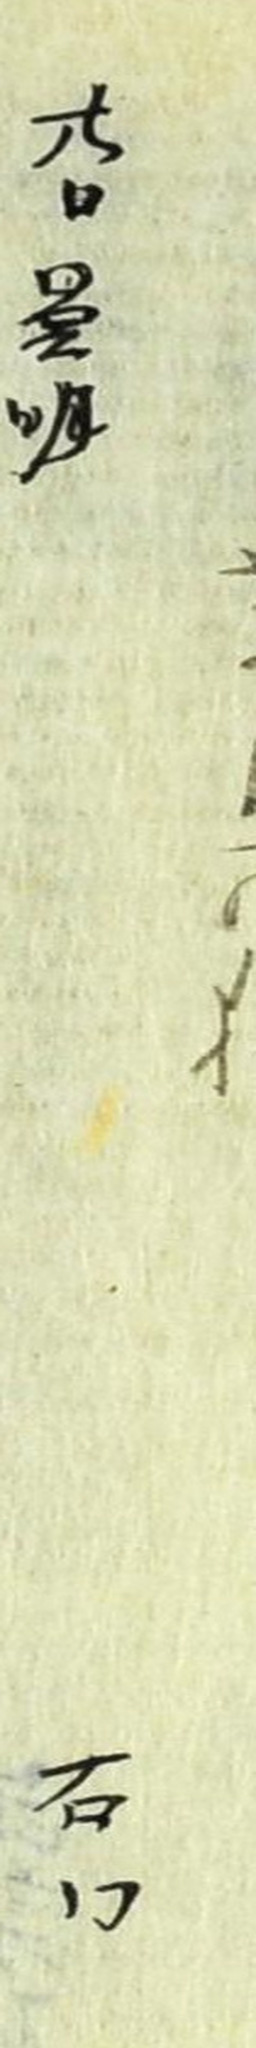廿日曇明右同
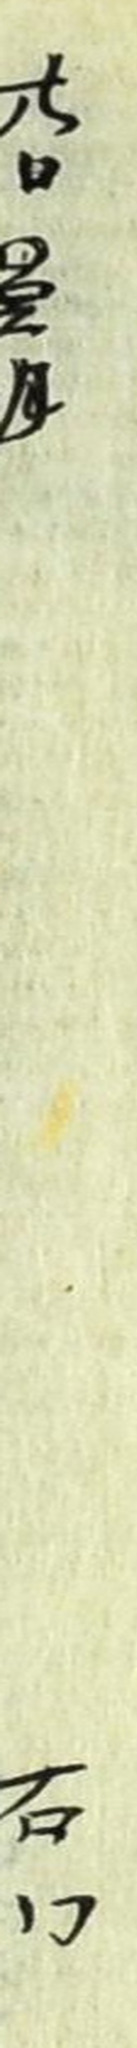廿日曇明右同
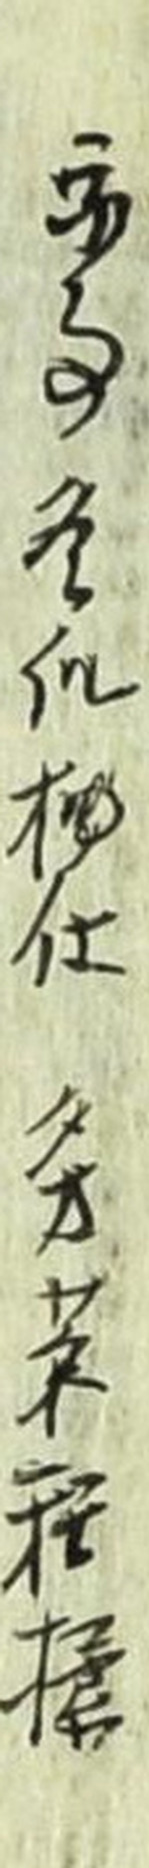家事冬瓜物仕夕方菜種揉
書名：（日記）
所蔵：福井県文書館 Fukui Prefectural Archives
